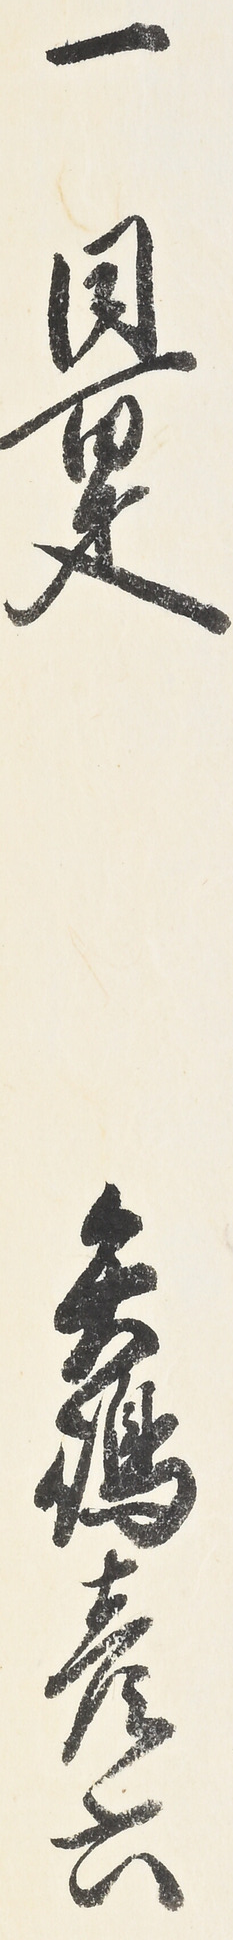一同百疋矢嶋彦六
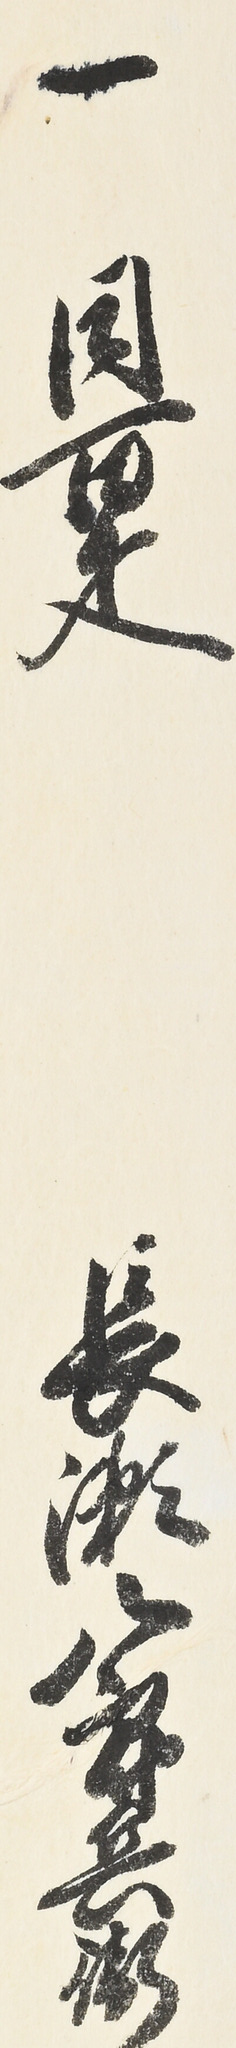一同百疋長瀬八郎兵衛
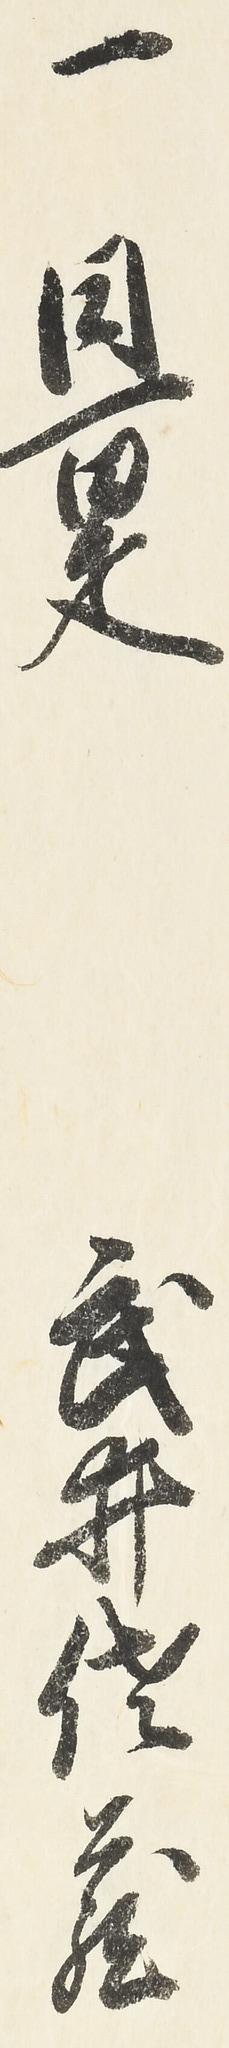一同百疋武井佐蔵
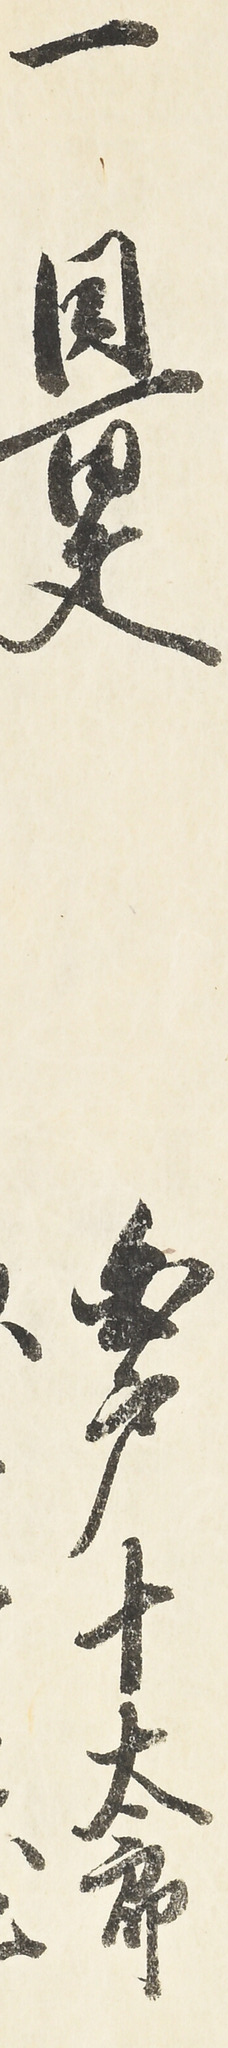一同百疋白戸十太郎
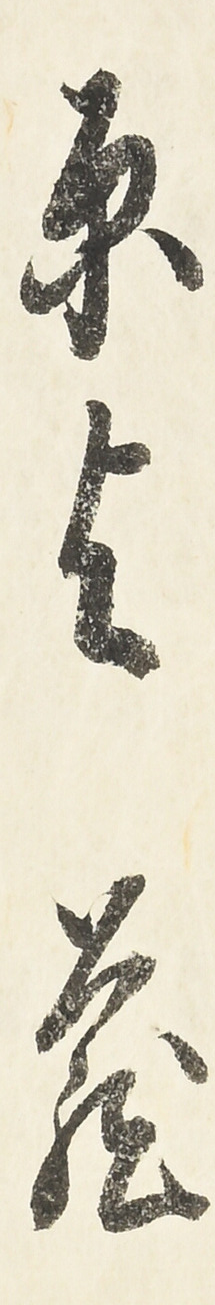原与蔵
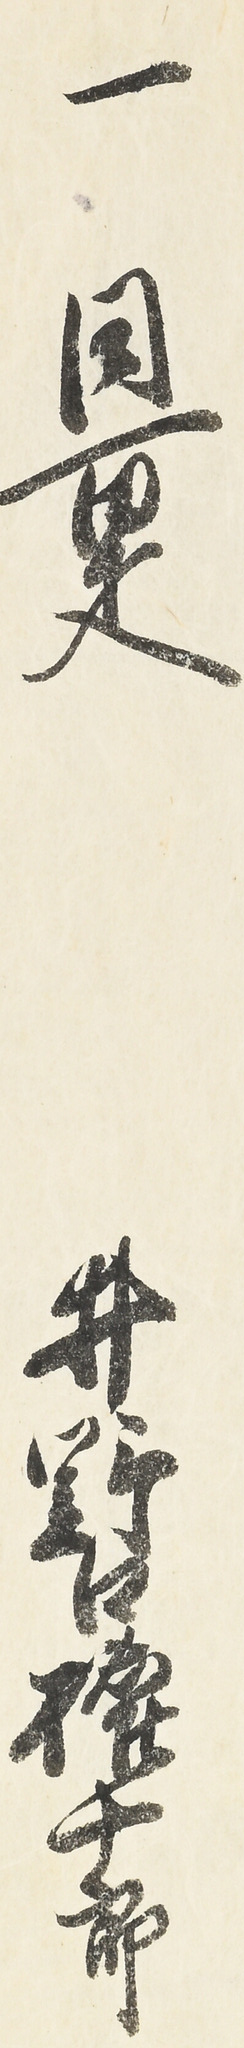一同百疋井野口権十郎

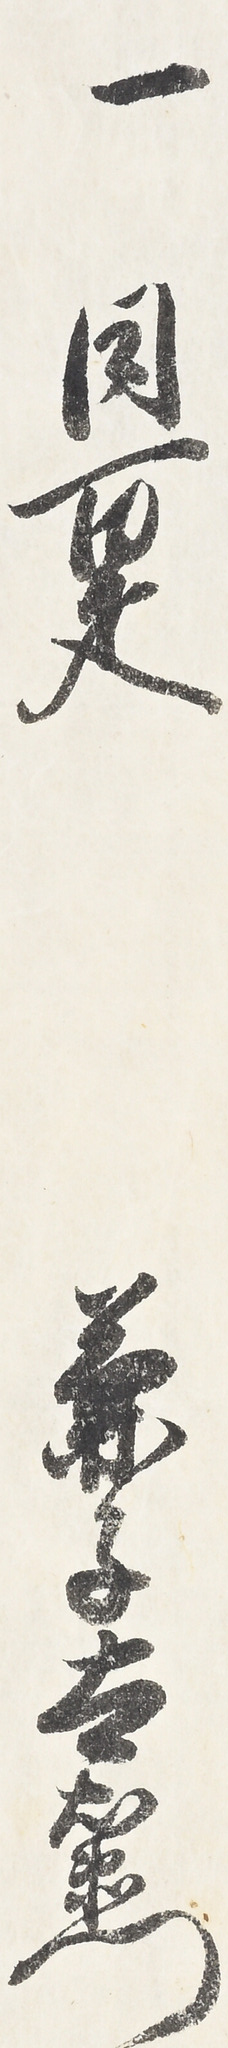一同百疋兼子太右衛門
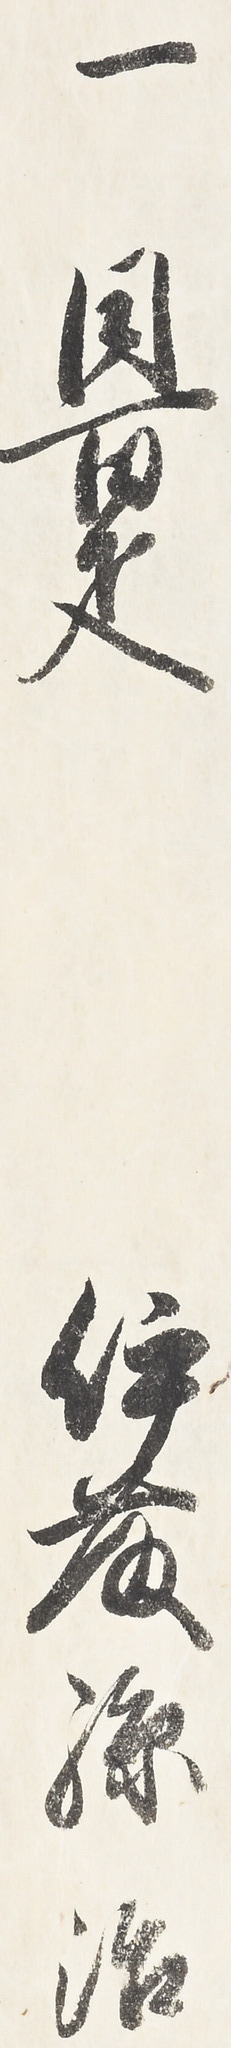一同百疋伊藤孫治
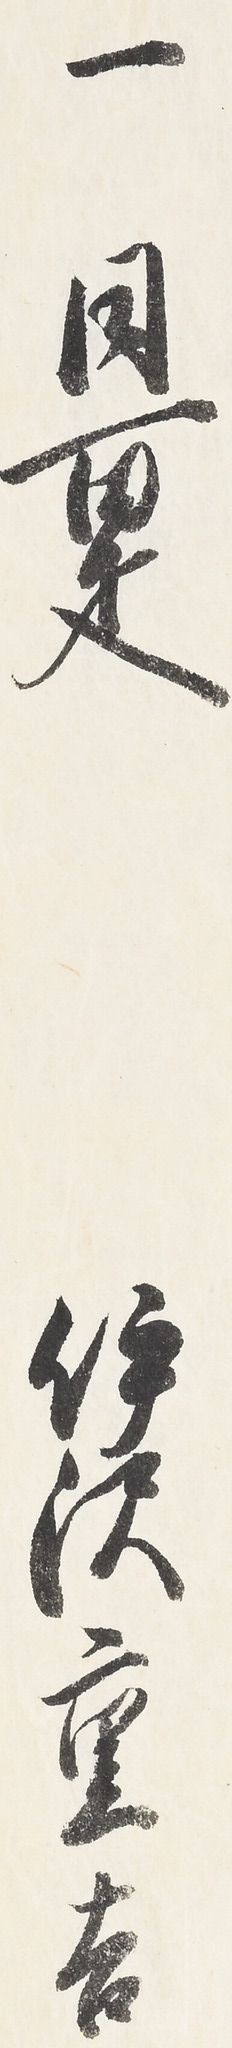一同百疋伊沢重吉
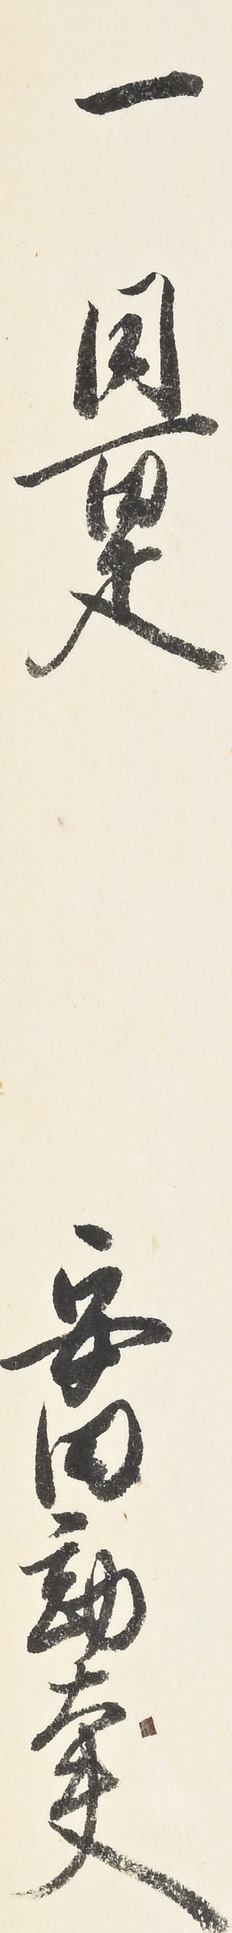一同百疋安田勘大夫
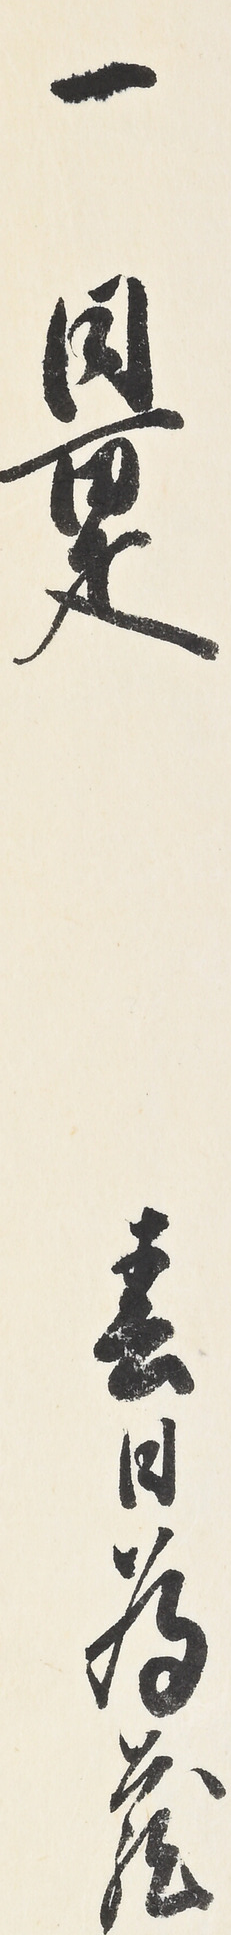一同百疋春日為蔵
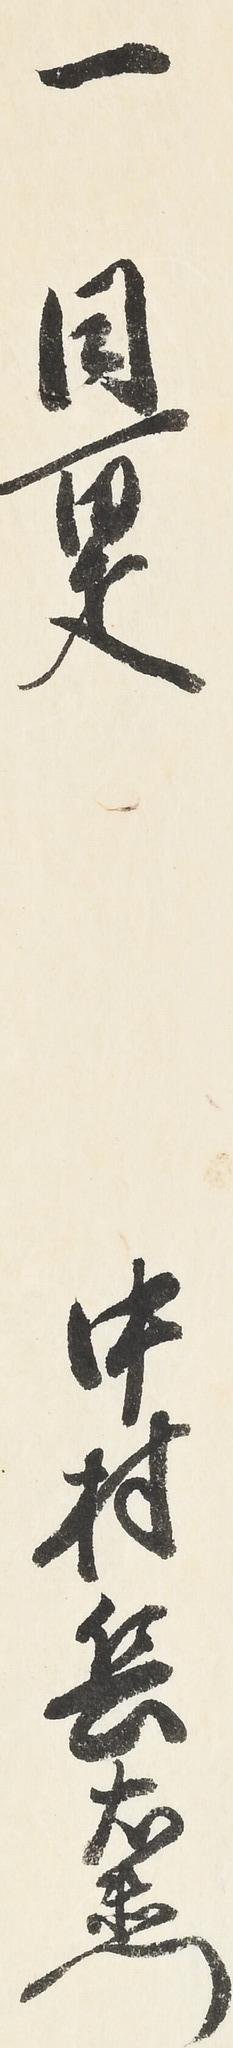一同百疋中村兵右衛門
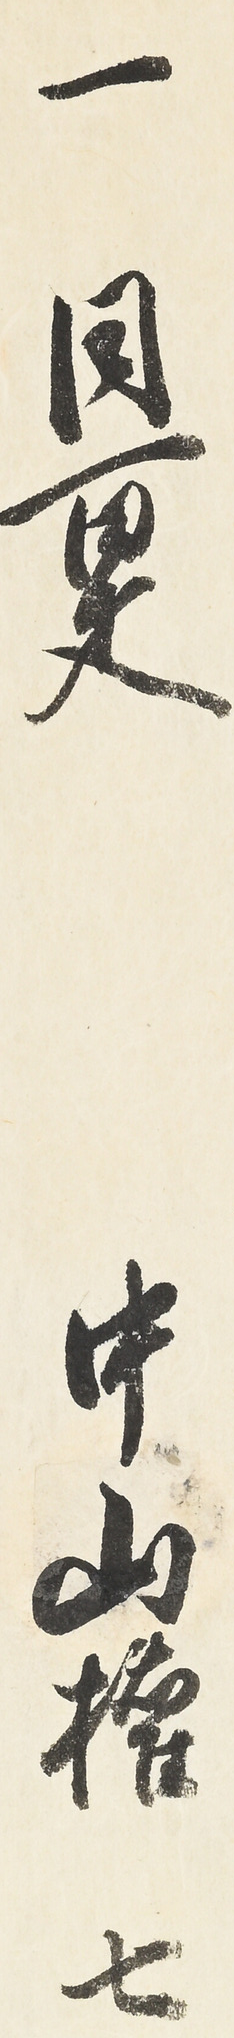一同百疋中山権七
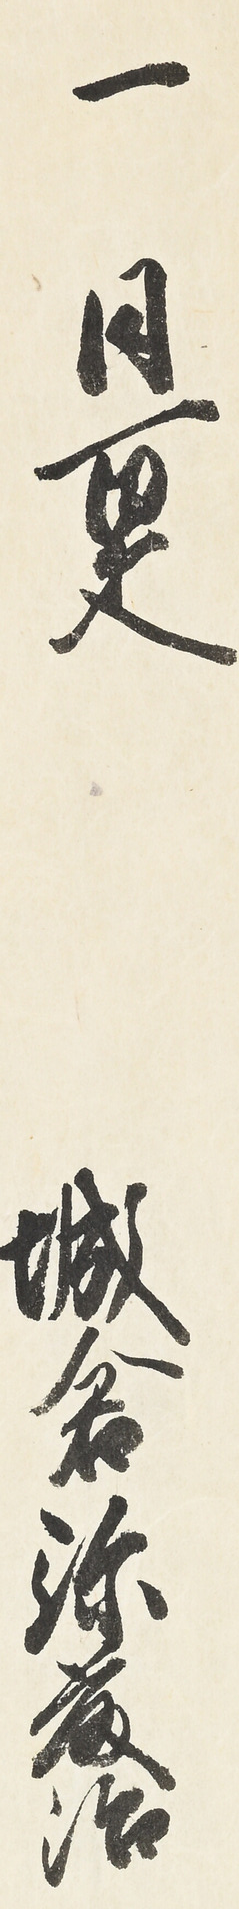一同百疋城倉弥藤治

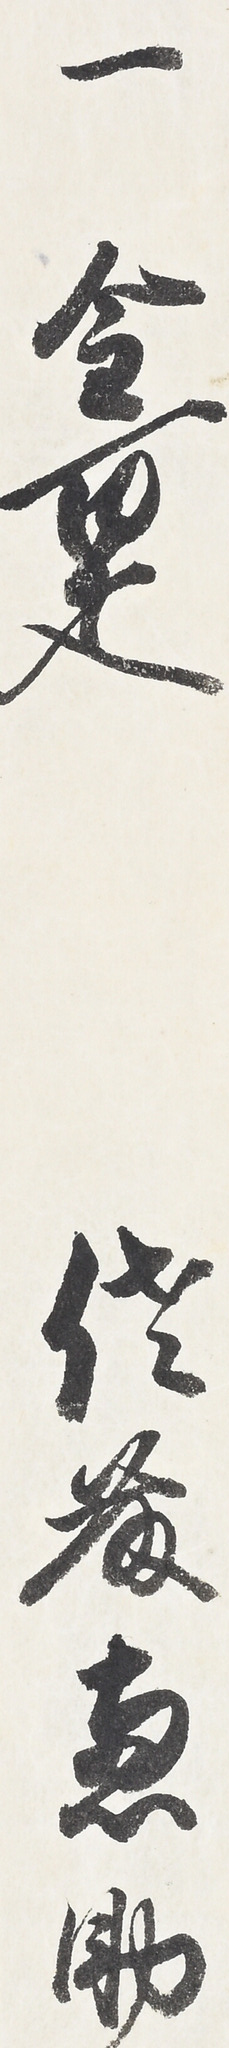一金百疋佐藤恵助
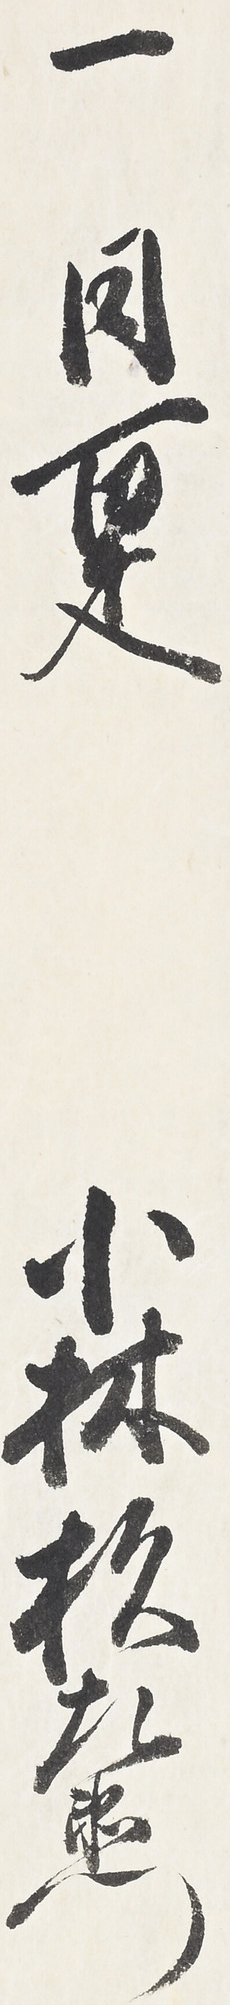一同百疋小林杉左衛門
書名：永代太々御神楽名前帳
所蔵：伊那市立高遠町図書館・合同会社AMANE
